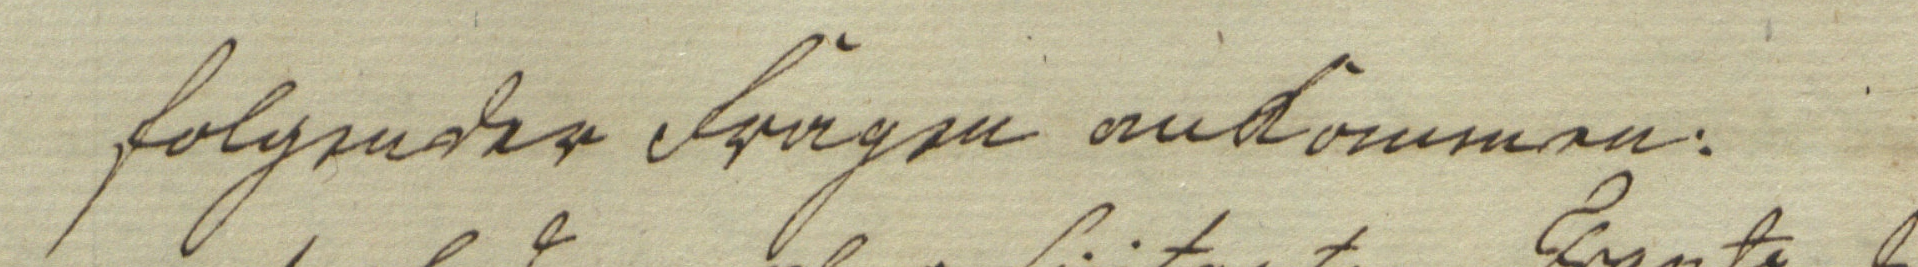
folgender Fragen ankommen:
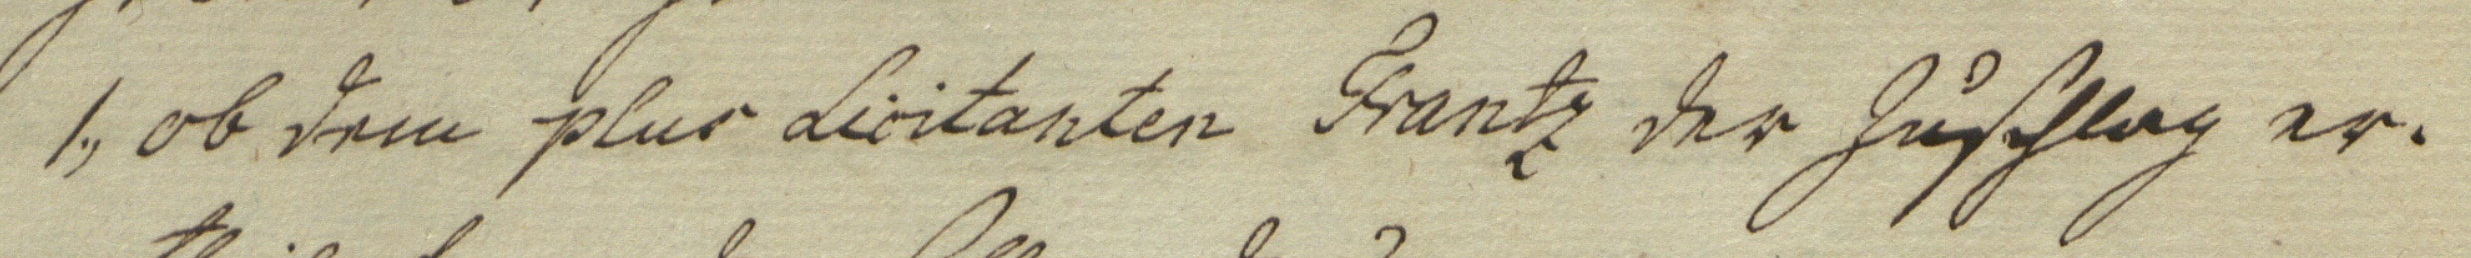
1., ob dem plus Licitanten Frantz der Zuschlag er¬
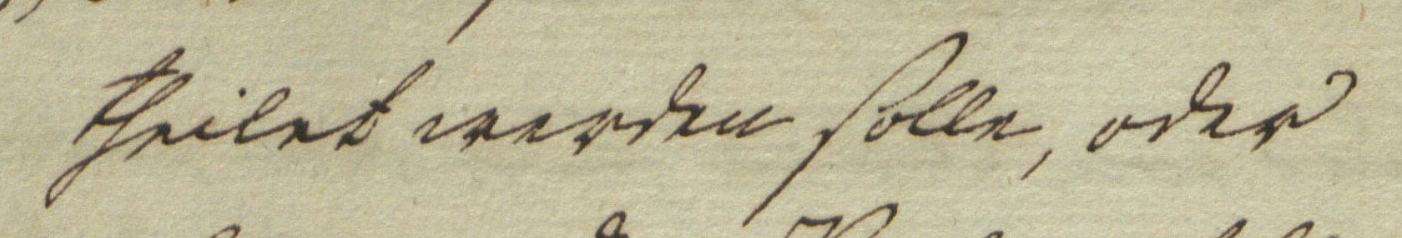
theilet werden solle, oder
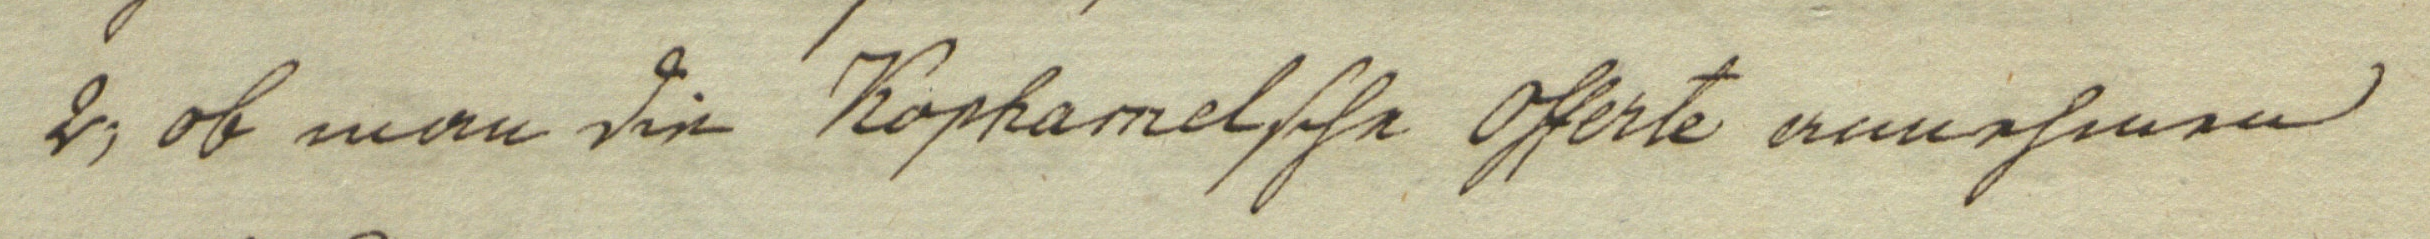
2., ob man die Kophamelsche Offerte annehmen
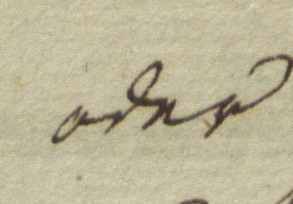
oder
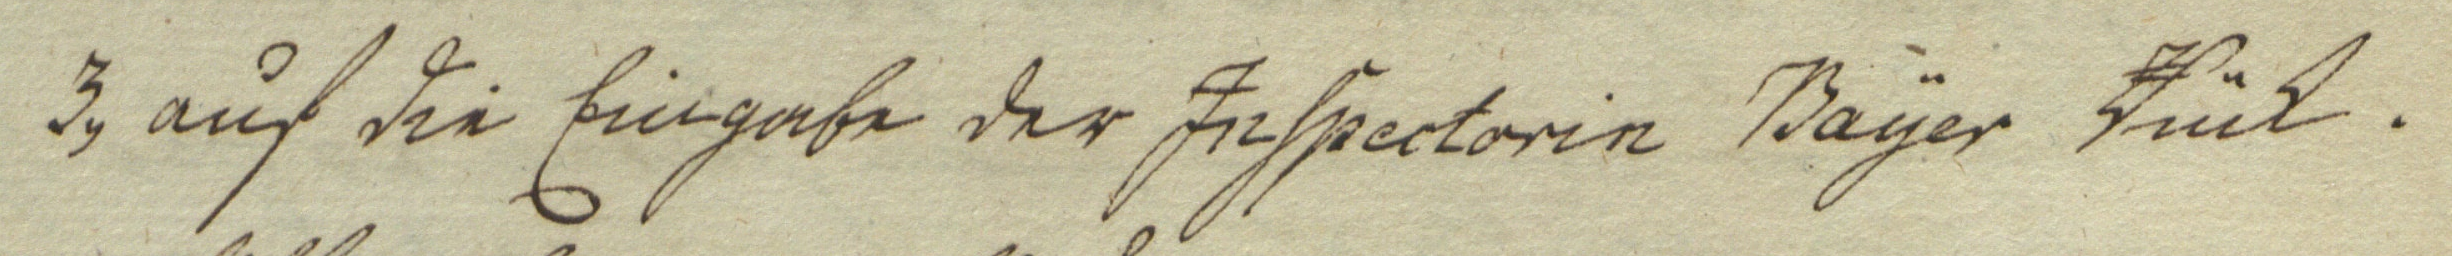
3., auf die Eingabe der Inspectorin Baÿer Rück¬
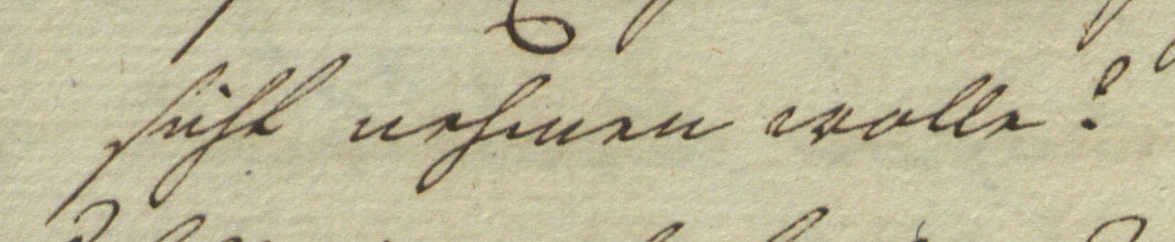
sicht nehmen wolle?
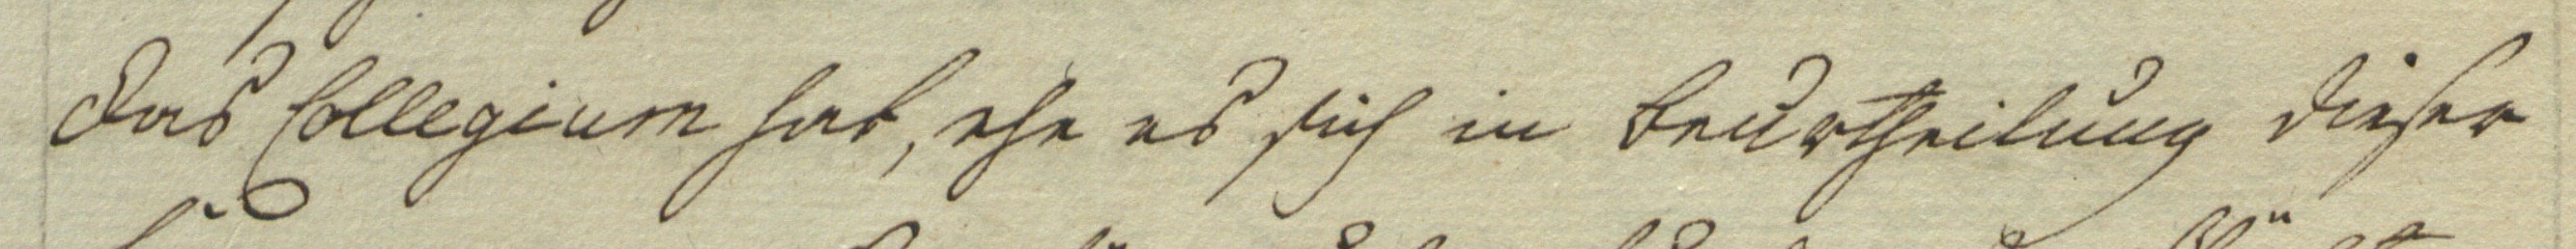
Das Collegium hat, ehe es sich in Beurtheilung dieser
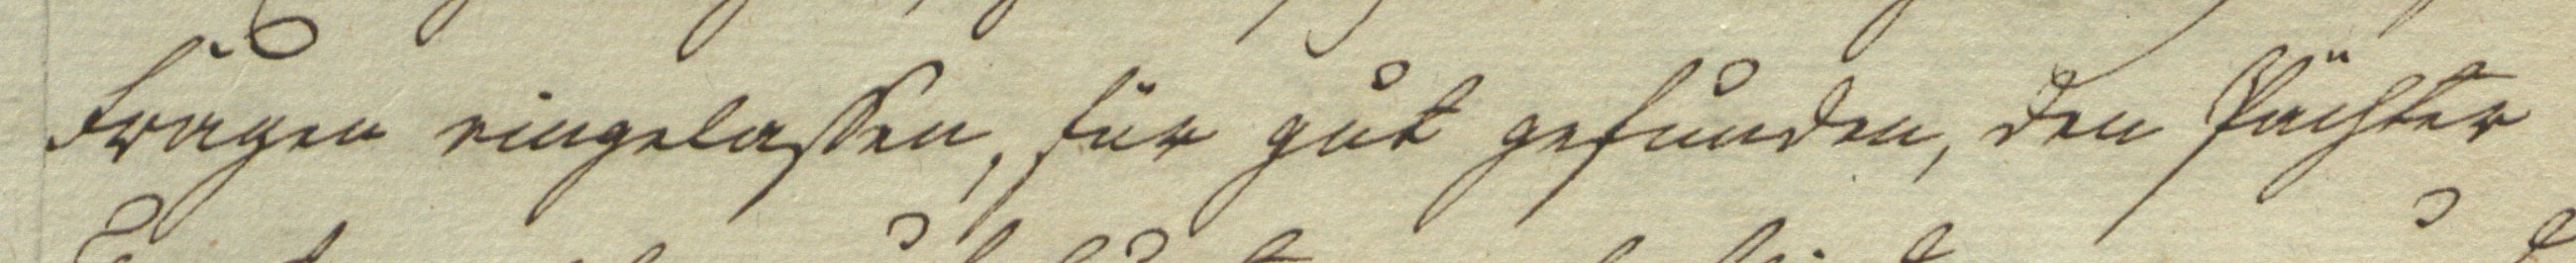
Fragen eingelassen, für gut gefunden, den Pächter
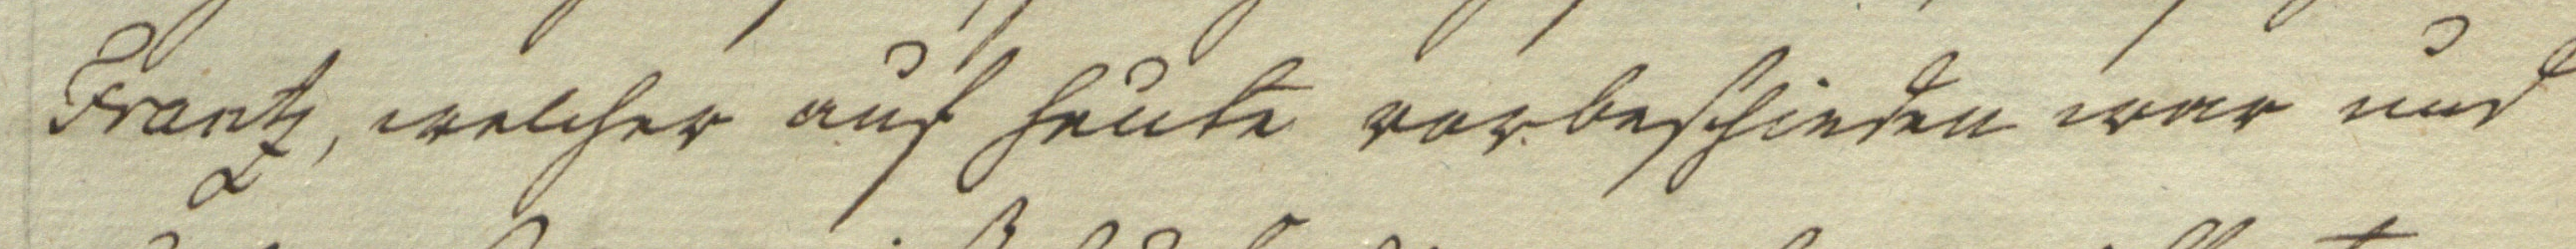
Frantz, welcher auf heute vorbeschieden war und
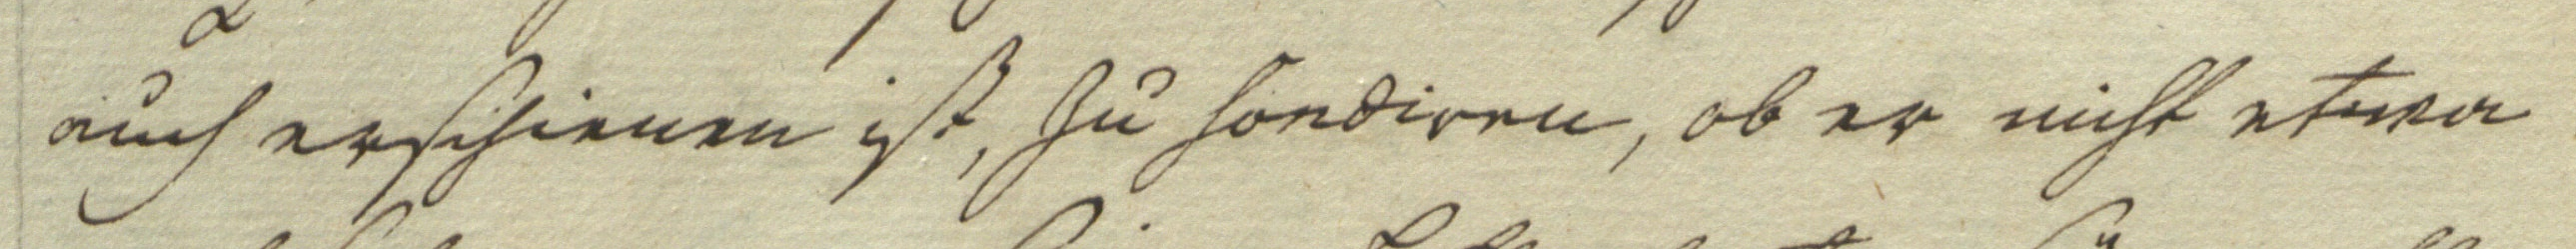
auch erschienen ist, zu sondiren, ob er nicht etwa
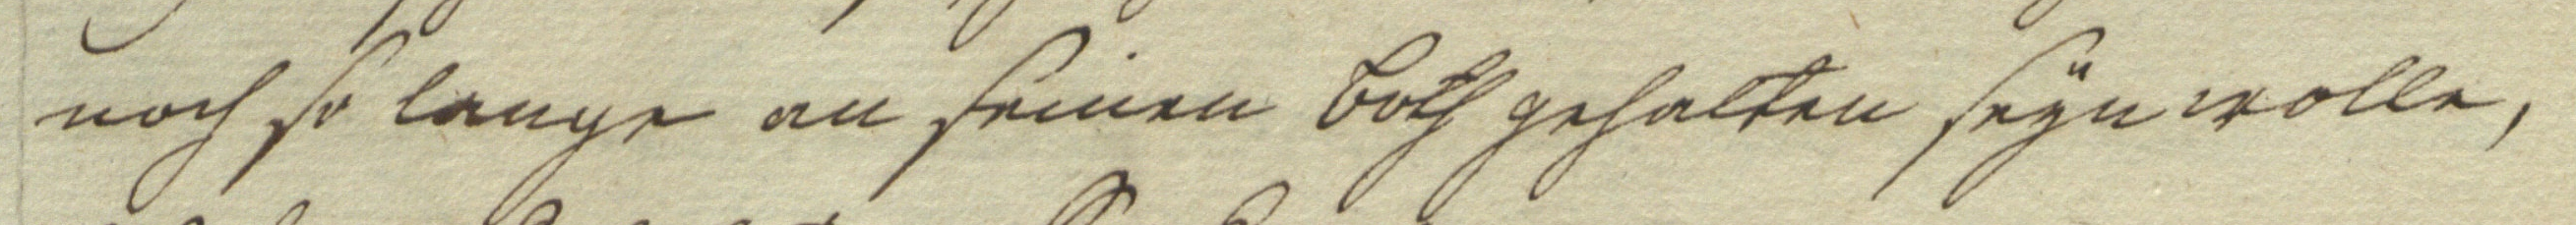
noch so lange an seinen Both gehalten seÿn wolle,
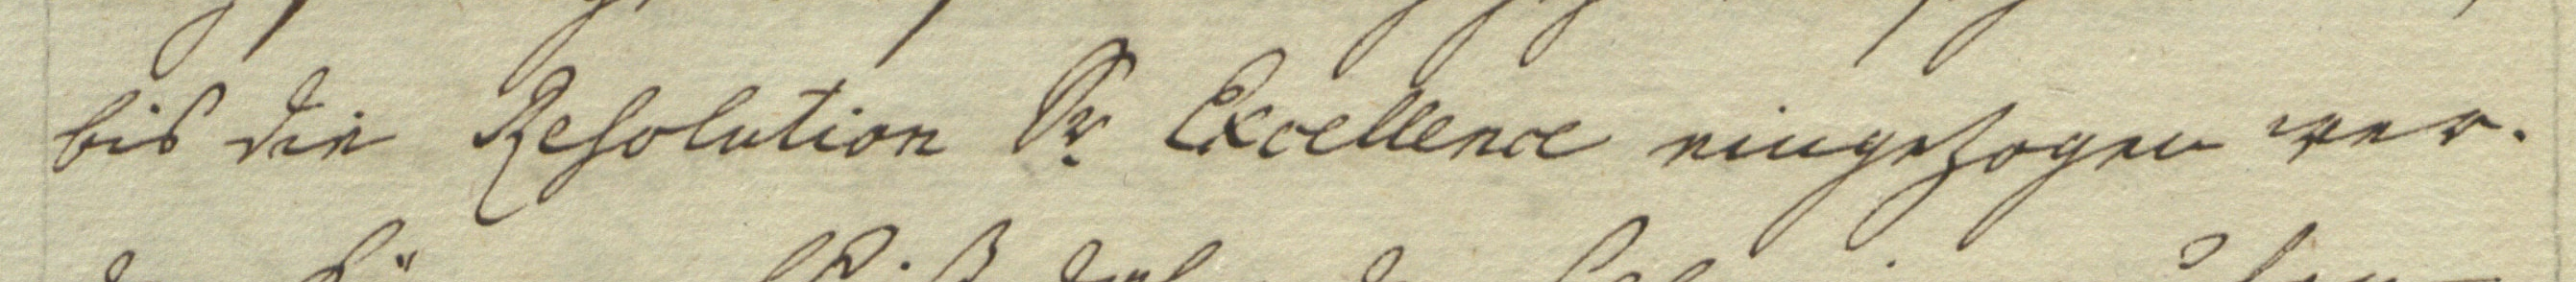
bis die Resolution Sr. Excellence eingezogen wer¬
